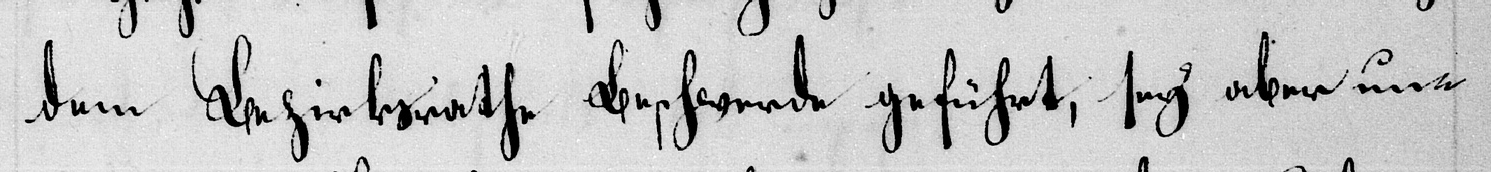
dem Bezirksrathe Beschwerde geführt, sey aber un¬
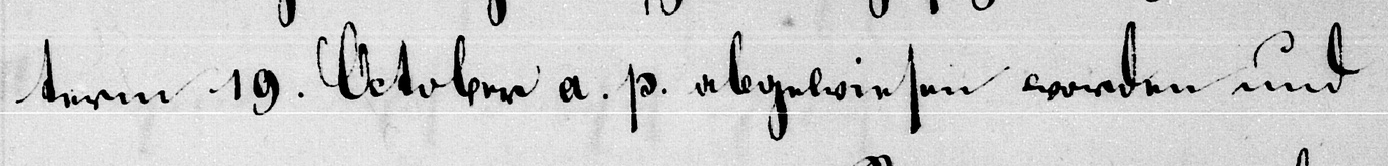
term 19. October a. p. abgewiesen worden und
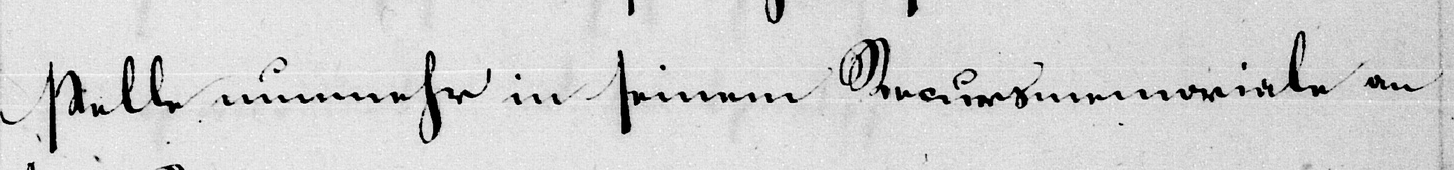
stelle nunmehr in seinem Recursmemoriale an
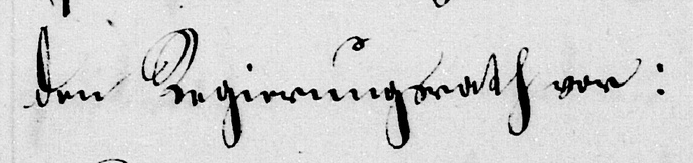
den Regierungsrath vor:
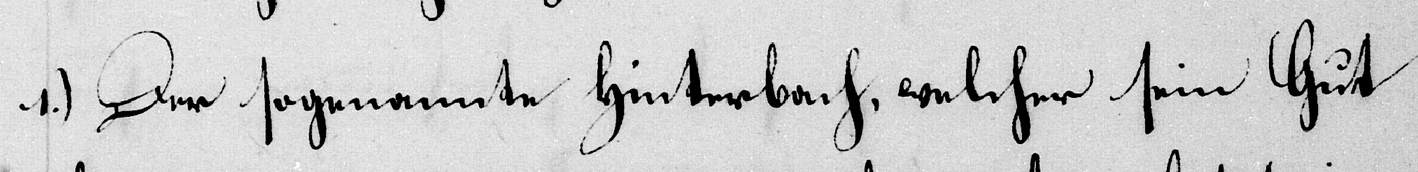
1.) Der sogenannte Hinterbach, welcher sein Gut
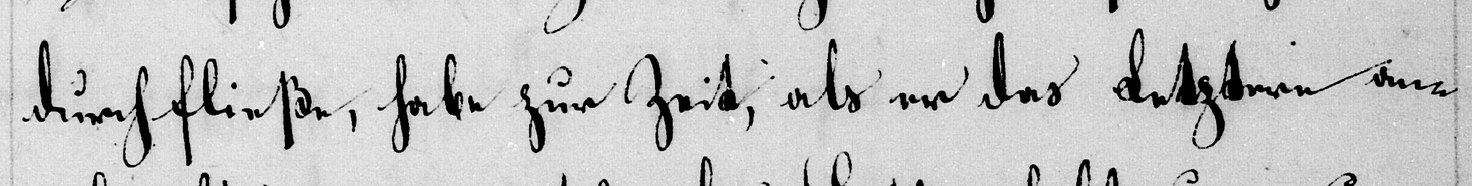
durchfließe, habe zur Zeit, als er das Letztere an¬
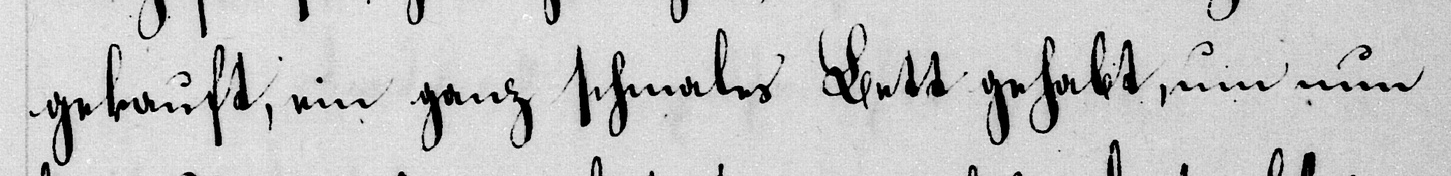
gekauft, ein ganz schmales Bett gehabt, um nun
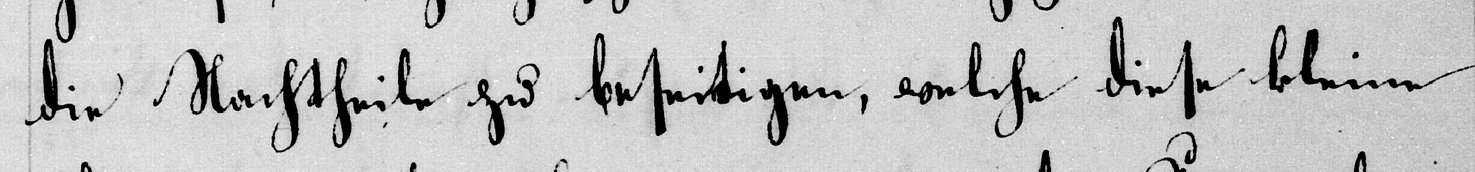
die Nachtheile zu beseitigen, welche diese kleine
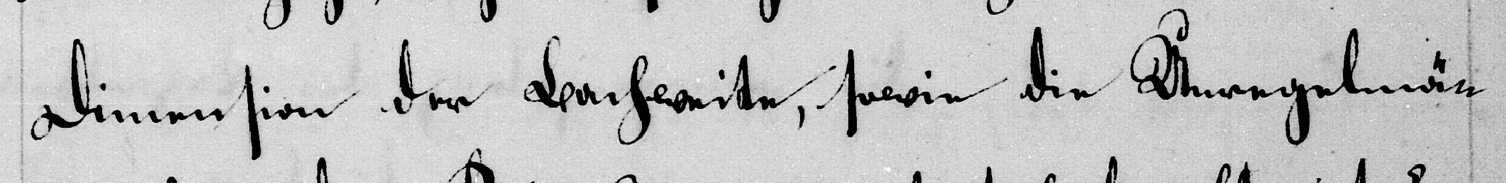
Dimension der Bachweite, sowie die Unregelmä¬
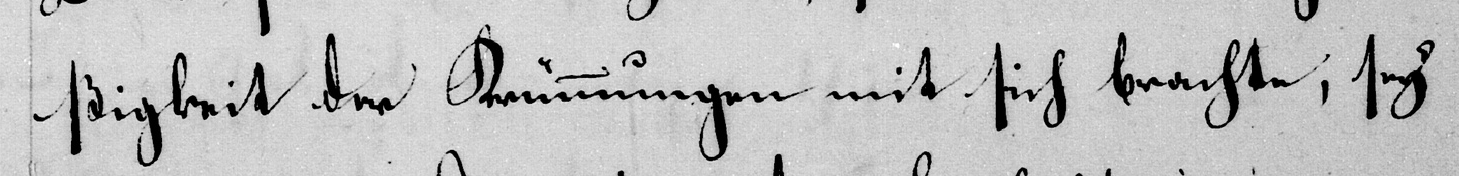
ßigkeit der Krümmungen mit sich brachte, sey
